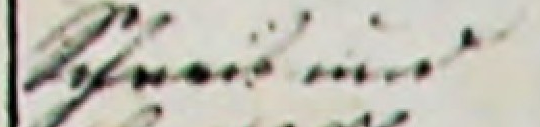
Schreib und
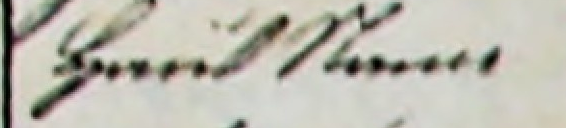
Haus Name
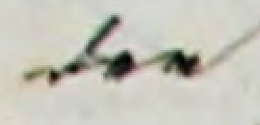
der
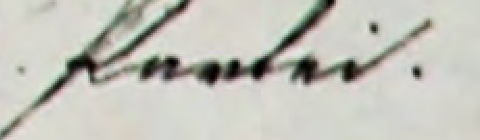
Partei.
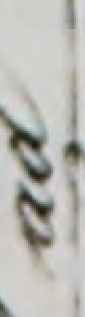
ad
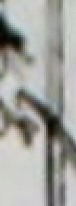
ffer.
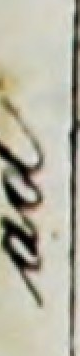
ad
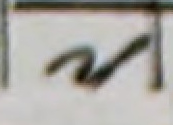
J.
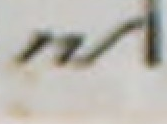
K.
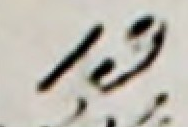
13
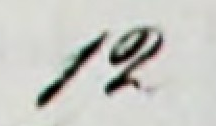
12
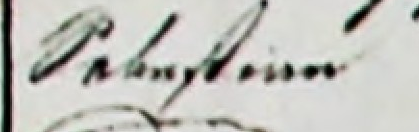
Sebastian
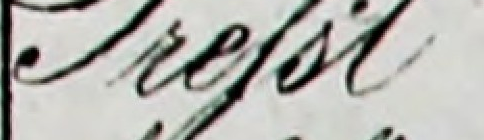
Pressl
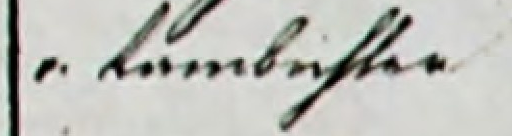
v. Lambichter
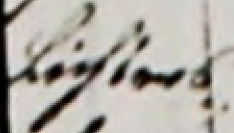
Lichters„
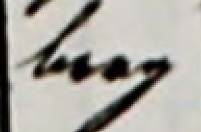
berg
